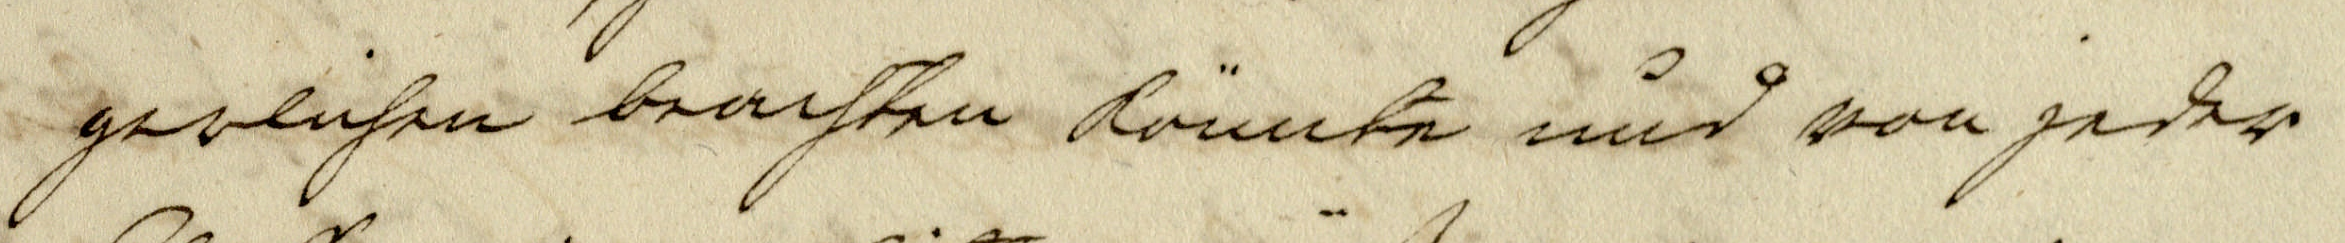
gerlichen beachten könnte und von jeder
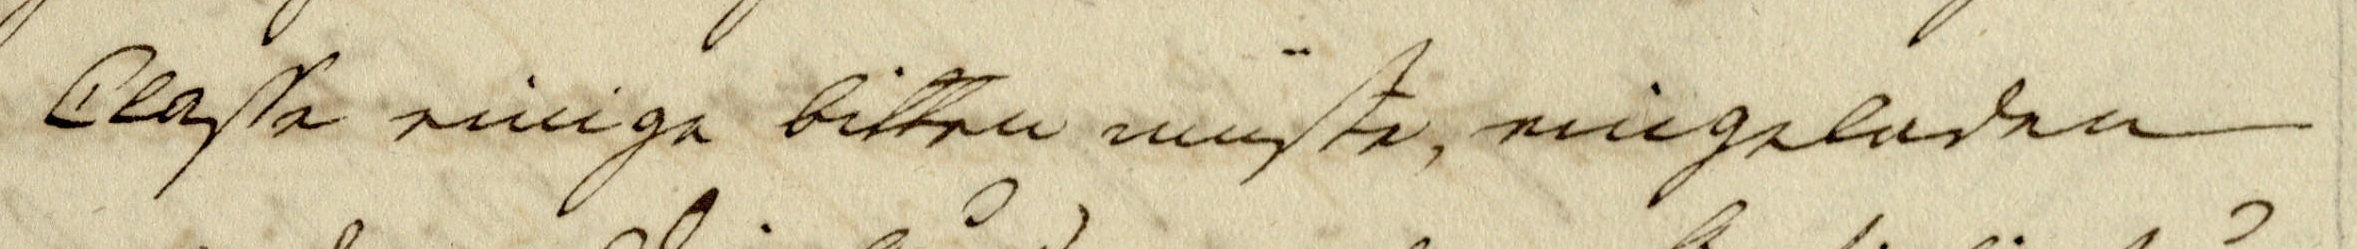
Classe einige bitten müßte, eingeladen
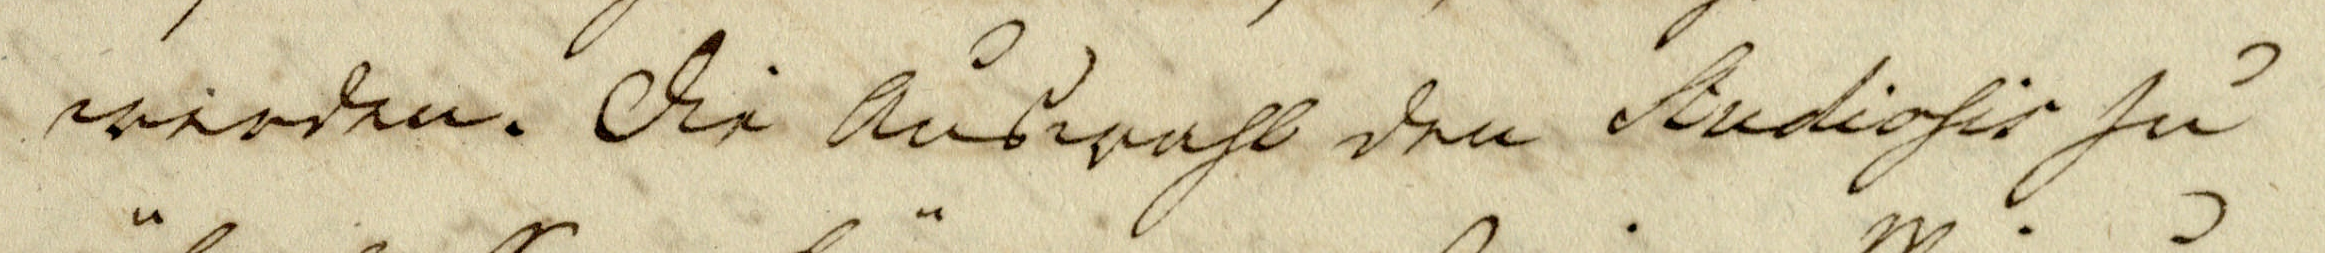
werden. Die Auswahl den Studiosis zu
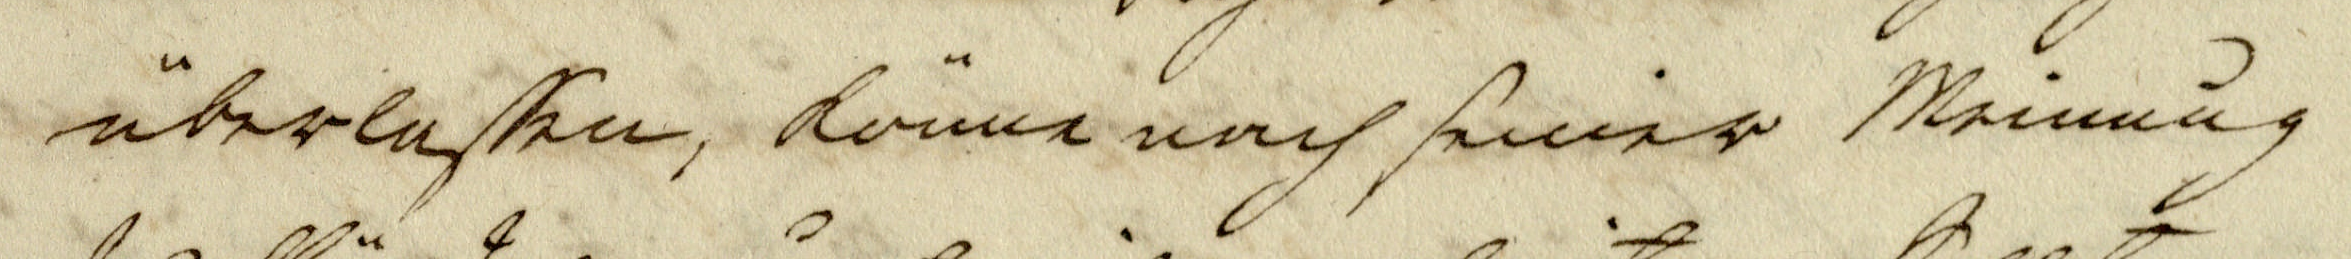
überlassen, könne nach seiner Meinung
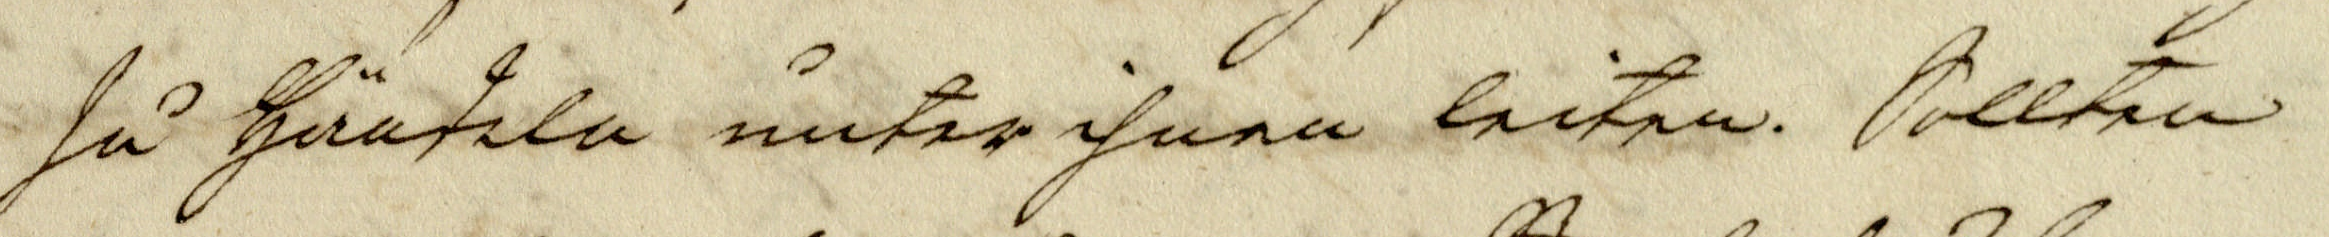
zu Händeln unter ihnen leiten. Sollten
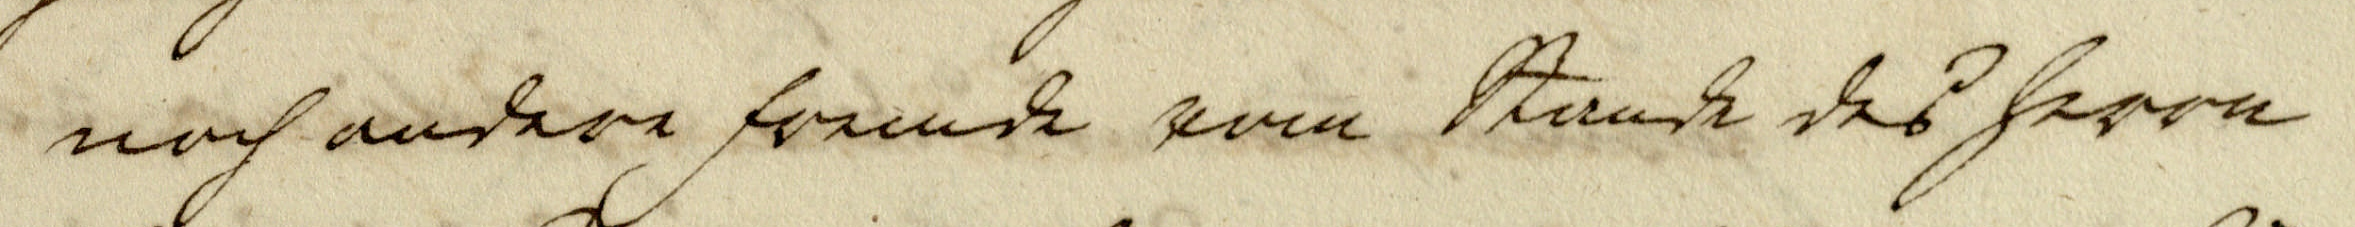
noch andere Fremde vom Stande des Herrn
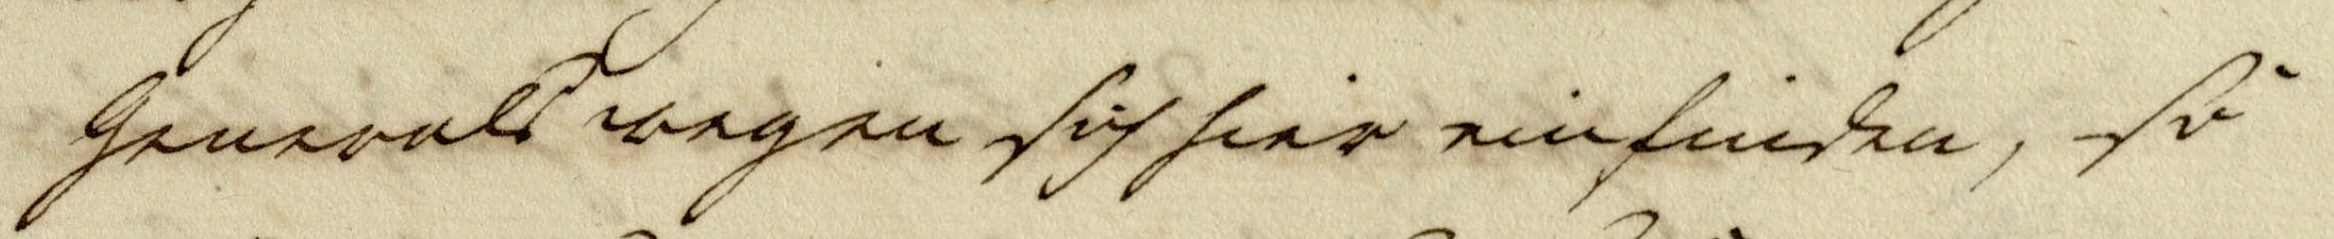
Generals wegen sich hier einfinden, so
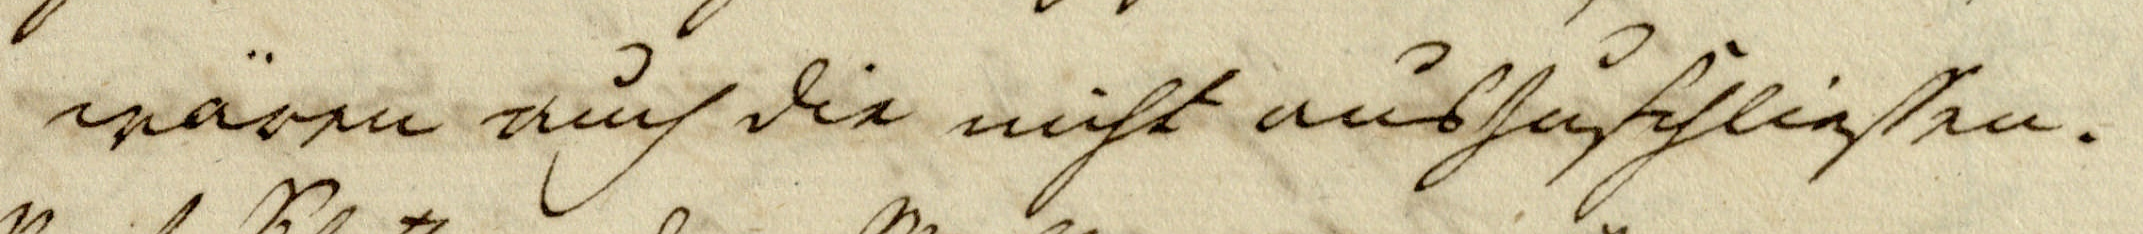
wären auch die nicht auszuschliessen.
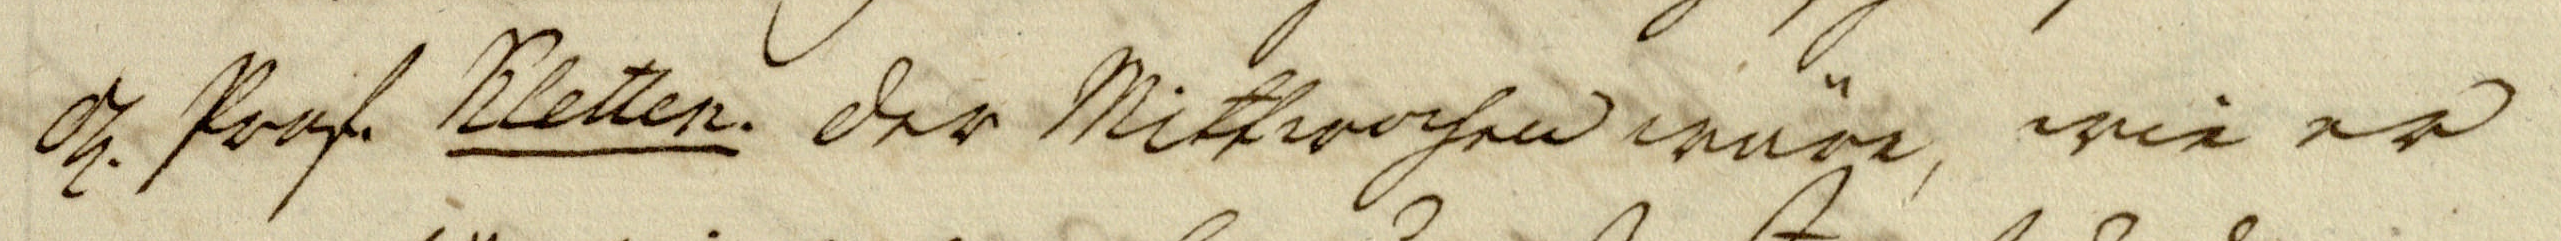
dh. Prof. Kletten. Der Mittwochen wäre, wie er
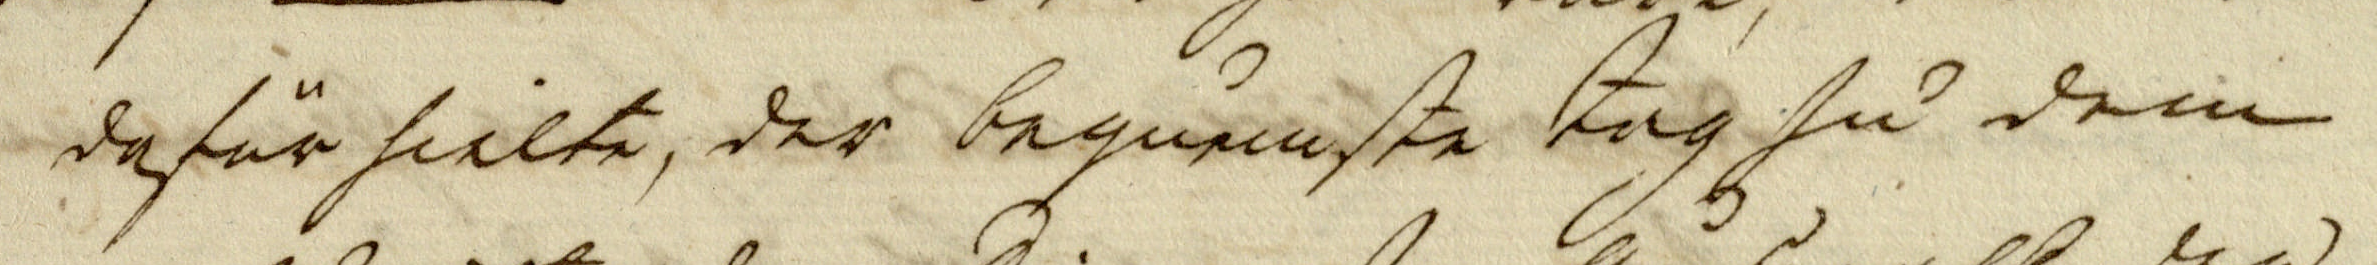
dafür hielte, der bequemste Tag zu dem
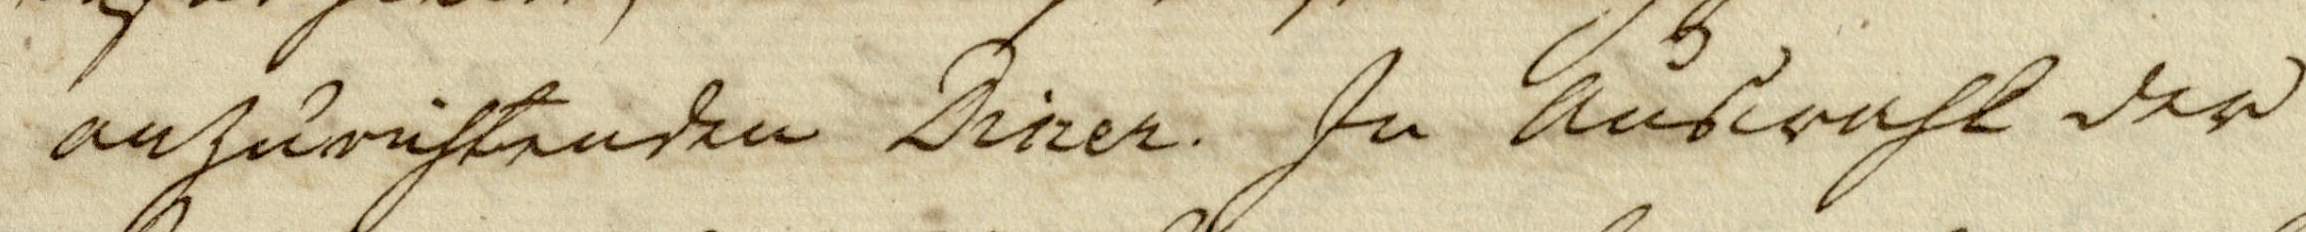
anzurichtenden Diner. In Auswahl der
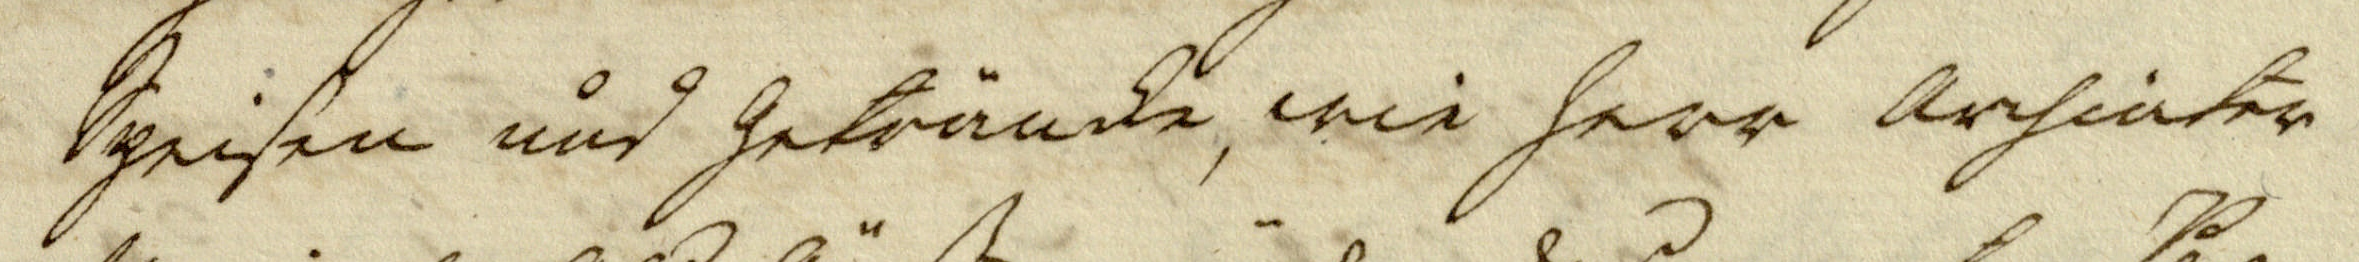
Speisen und Geträncke, wie Herr Archiater
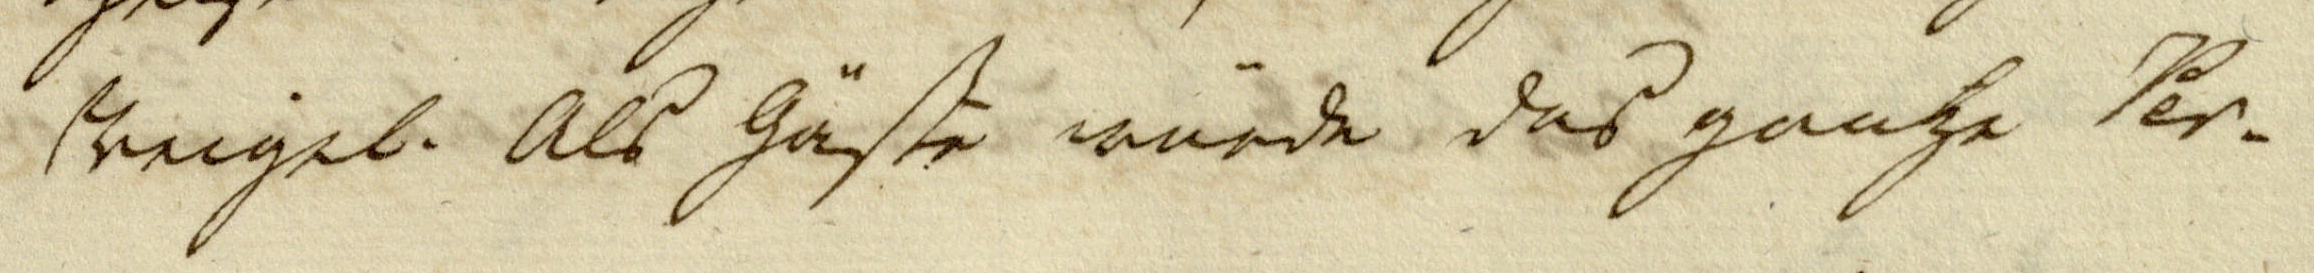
Weigel. Als Gäste würde das gantze Per¬
